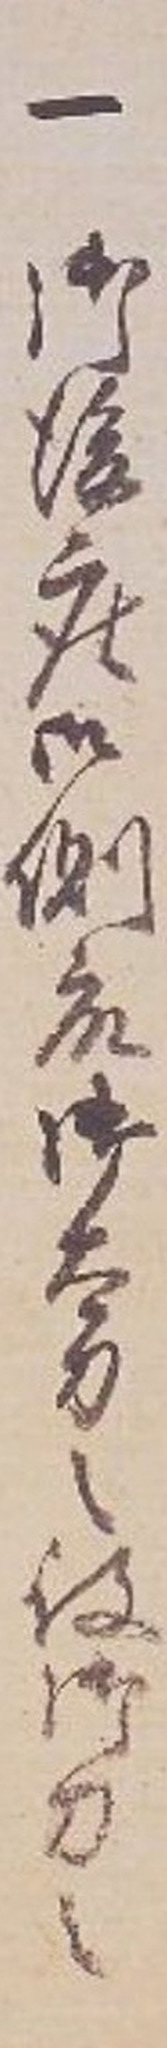一御後座御側衆御太刀之役御刀之
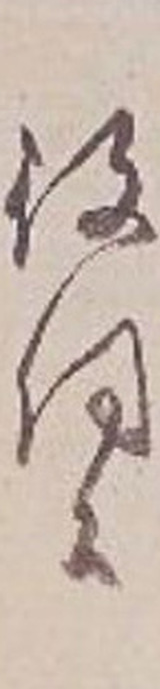役伺候
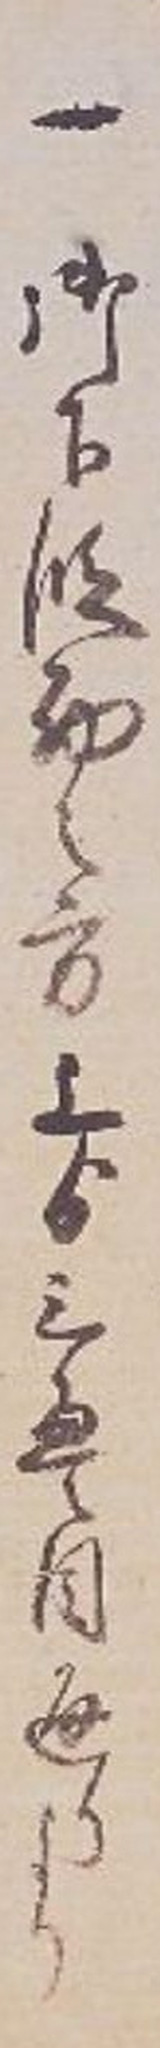一御下段西之方上ゟ三畳目通りより
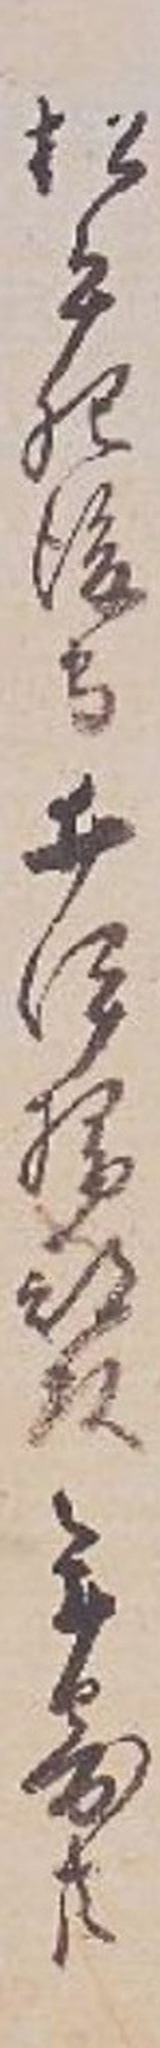松平肥後守井伊掃部頭年寄共
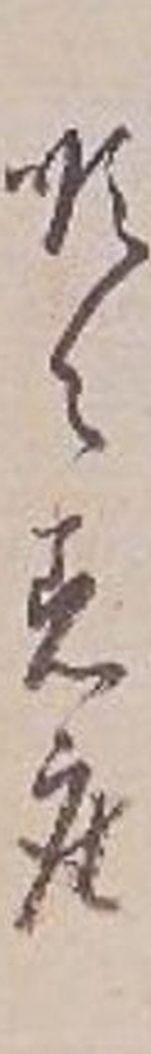順々着座

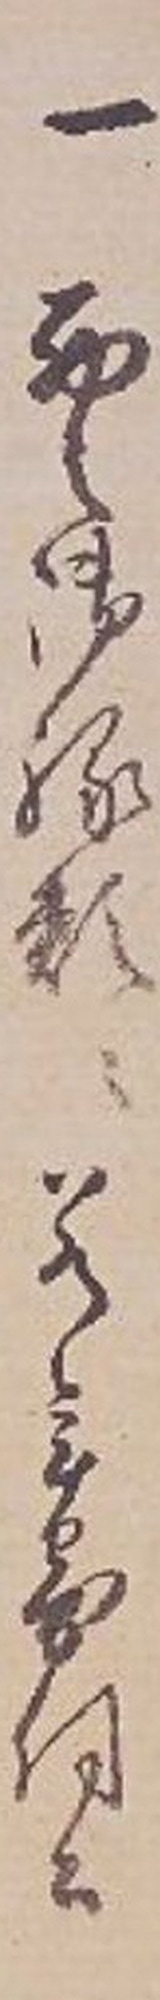一西之御縁類に若年寄伺候
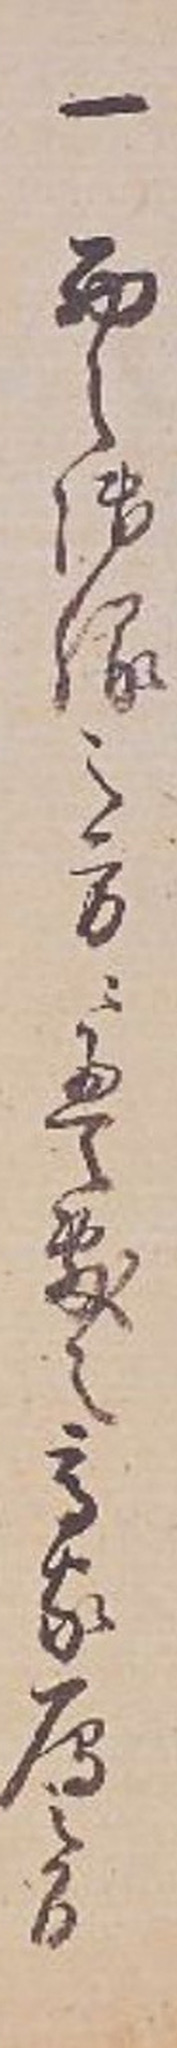一西之御縁之方に畳敷之高家鷹之間
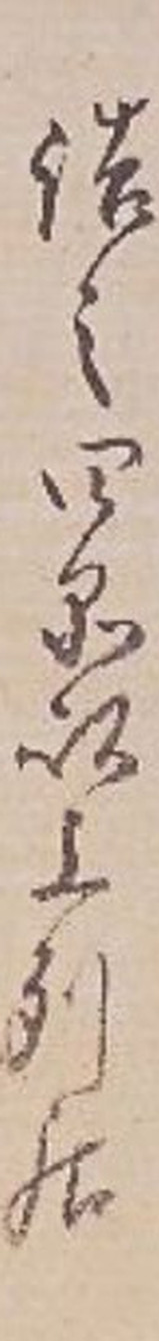詰之四品以上列居
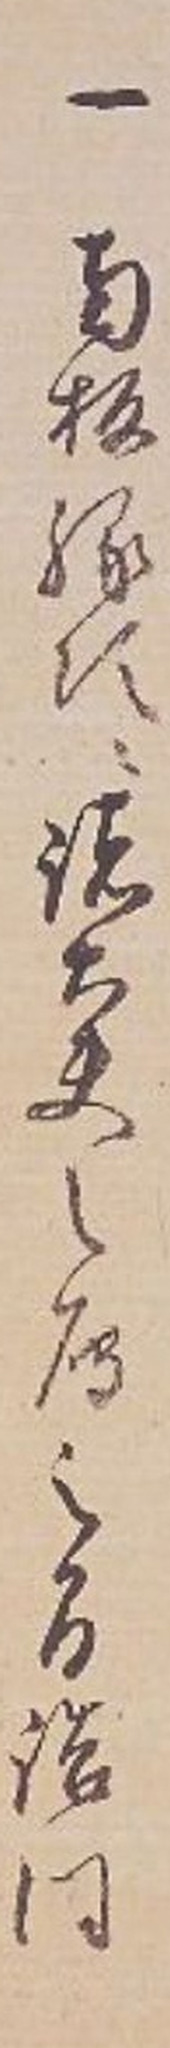一南板縁頭に諸大夫之鷹之間詰同
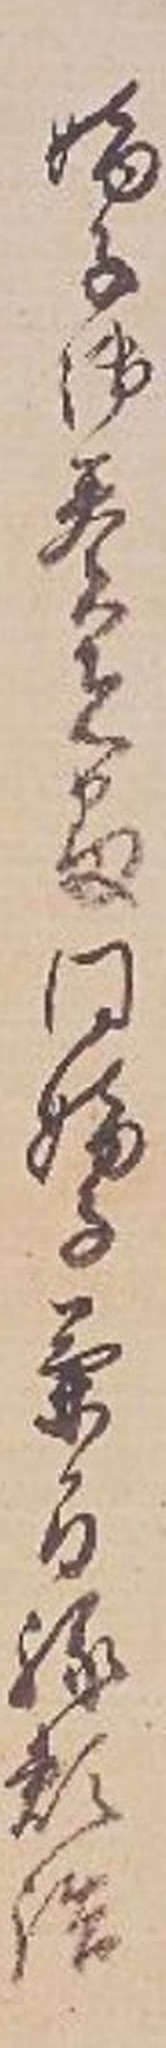嫡子御奏者番同嫡子菊間縁類詰
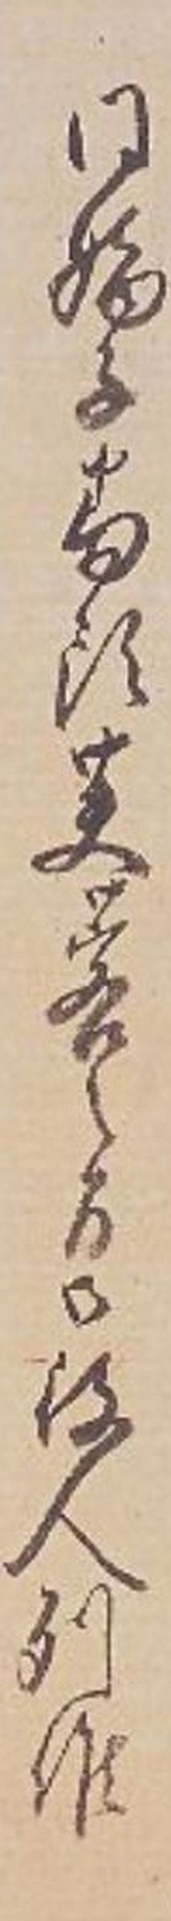同嫡子番頭芙蓉之間御役人列候
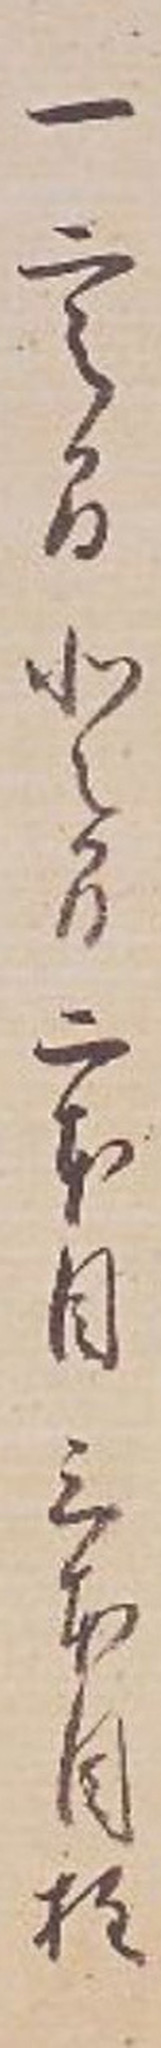一二之間北之間二本目三本目柱
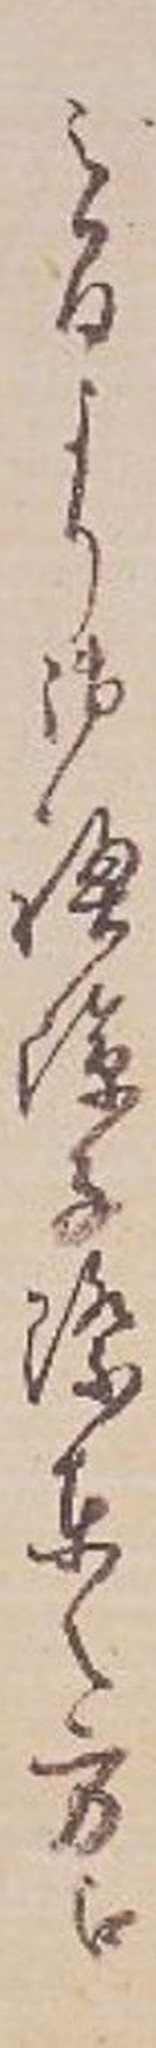之間より御襖障子際東之方え
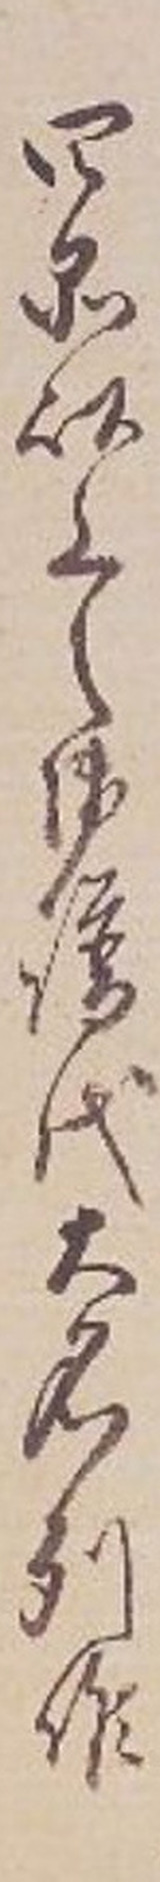四品以上之御譜代大名列候
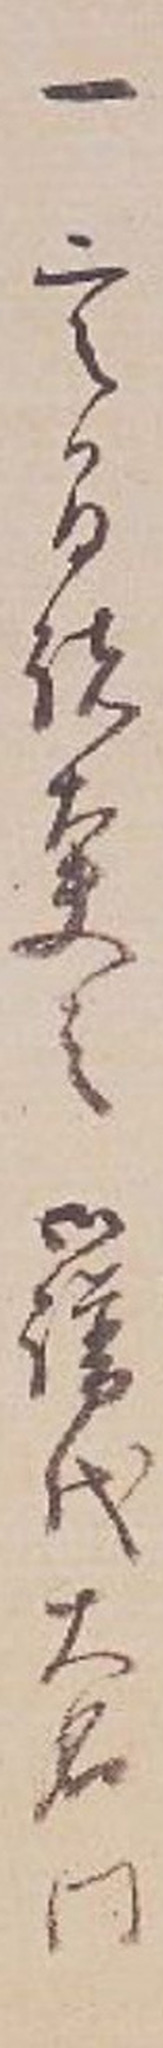一二之間諸大夫之御譜代大名同
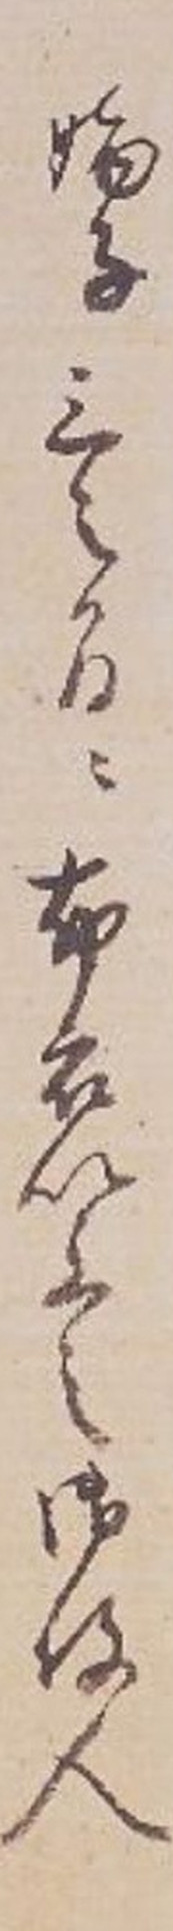嫡子三之間に布衣以上の御役人
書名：琉球人来朝記 三、四
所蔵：University of the Ryukyus Library
